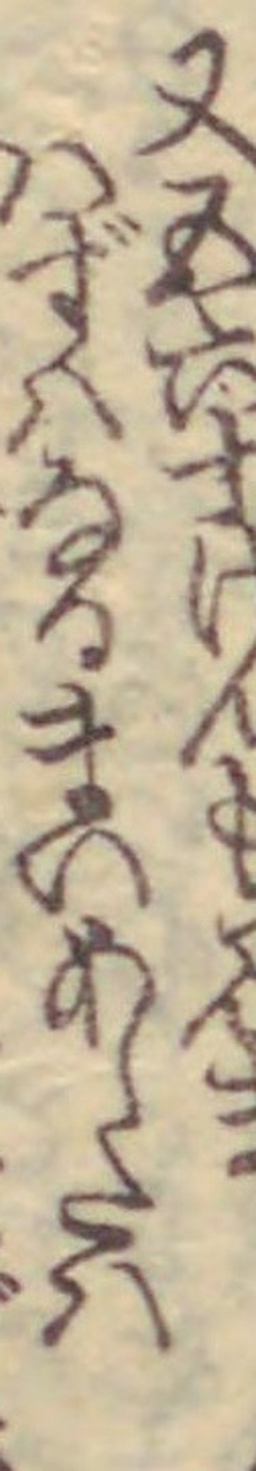はずはなるまいあしたは
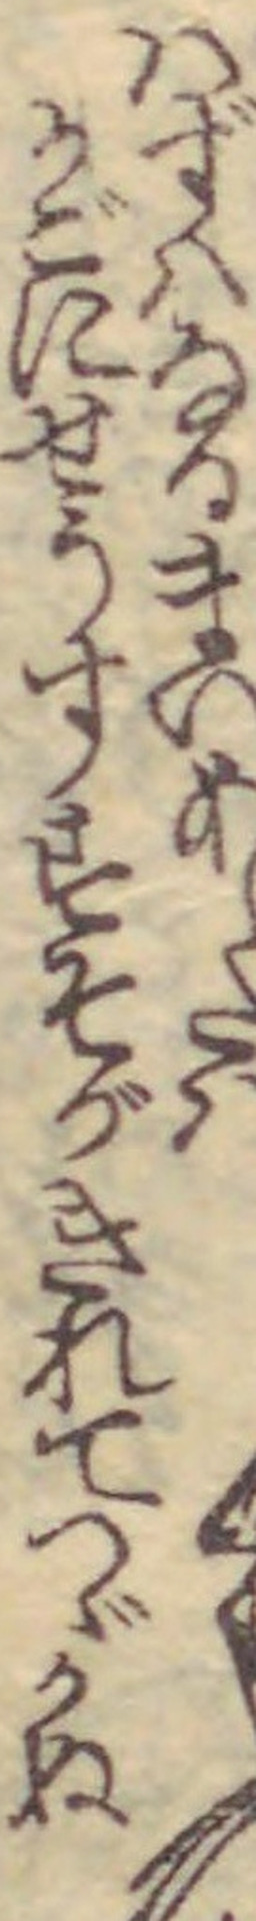かごにせうすすそがきれてつゞかぬ

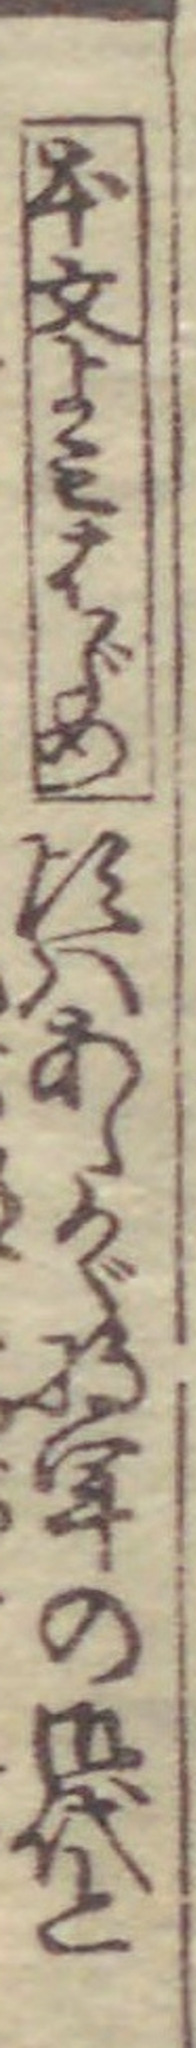[本文よみはじめ]頃はあしかゞ将軍の御代と
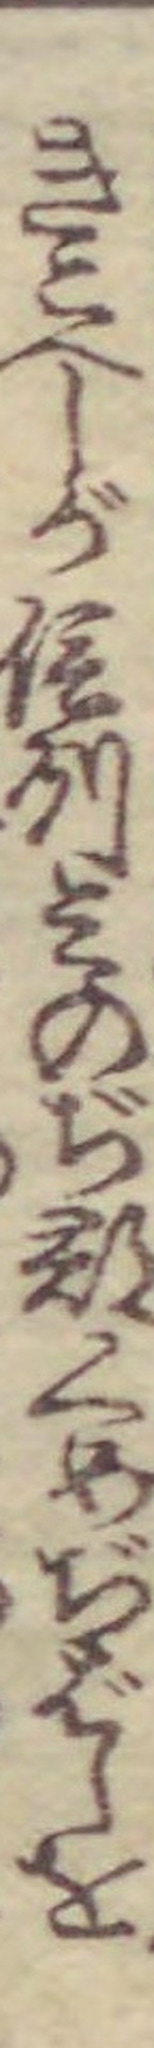きこへしが信州みのぢ郡くめぢばしを
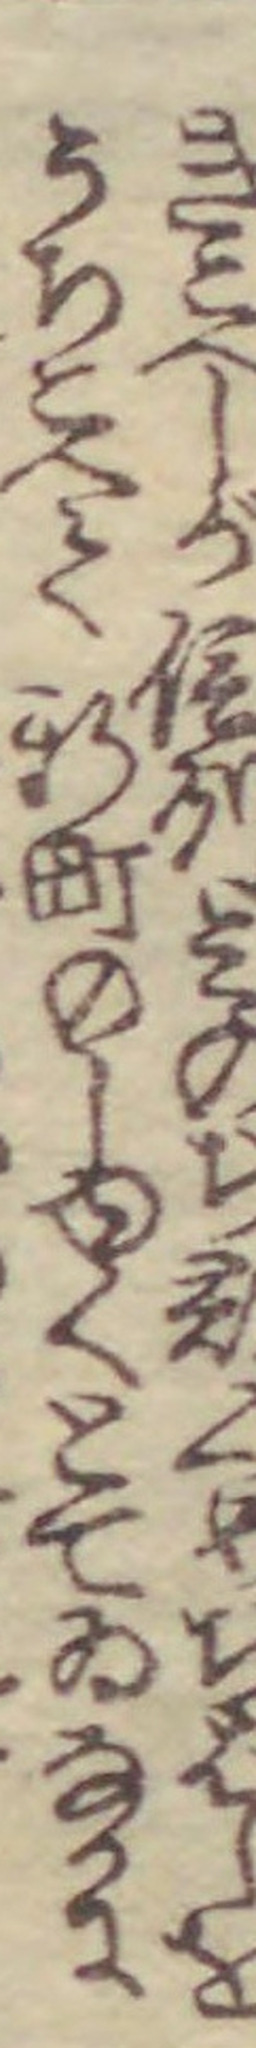うちこへて新町のしゆくとてゐなかに
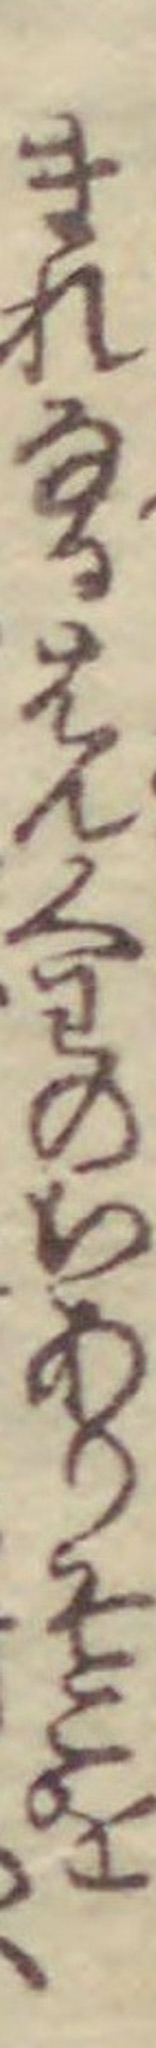まれなるはんくわのちありそこを
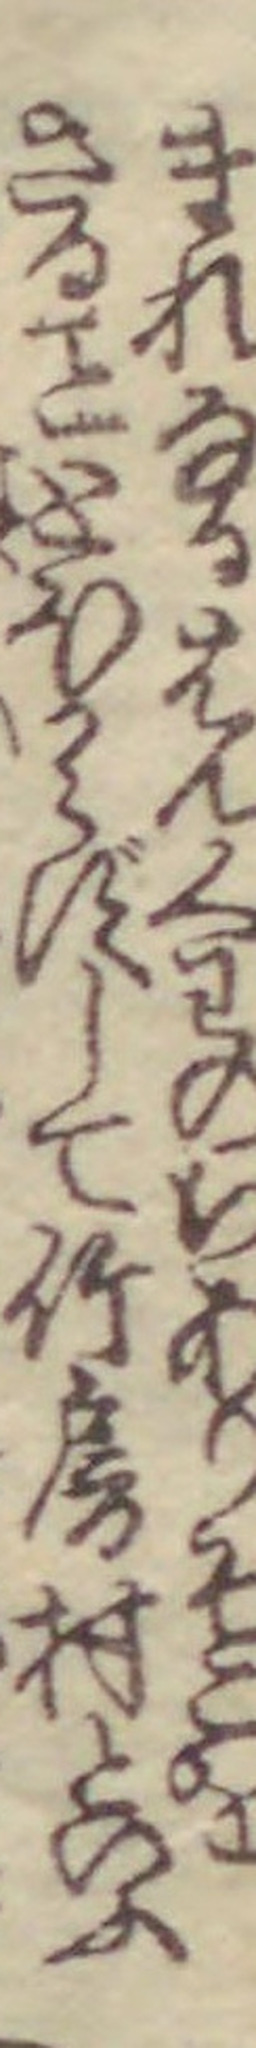さることとほからずして竹房村といふ
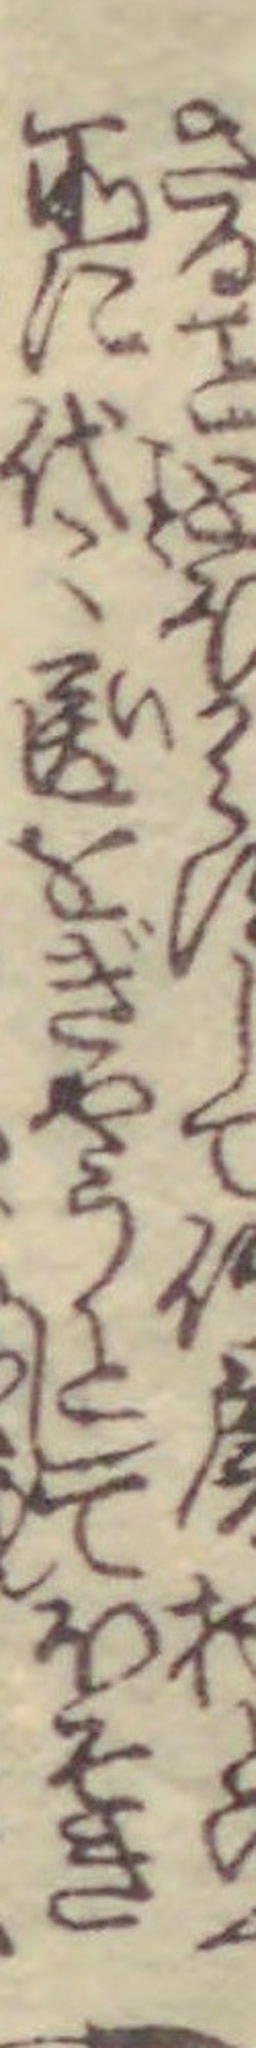所に代々医をぎやうとしてほそき
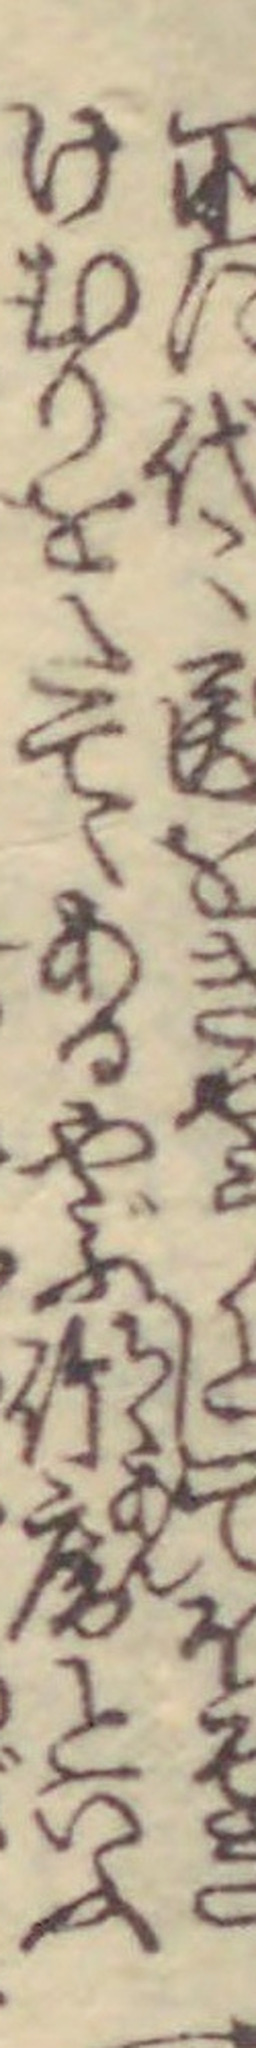けむりをたてゝあるやぶ竹庵といふ
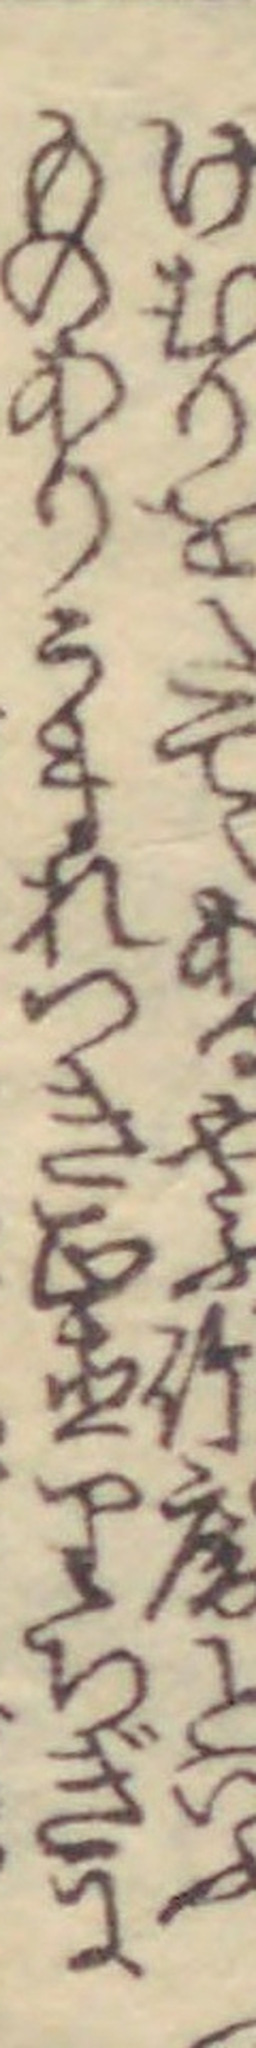ものありうまれつき正直りちぎに
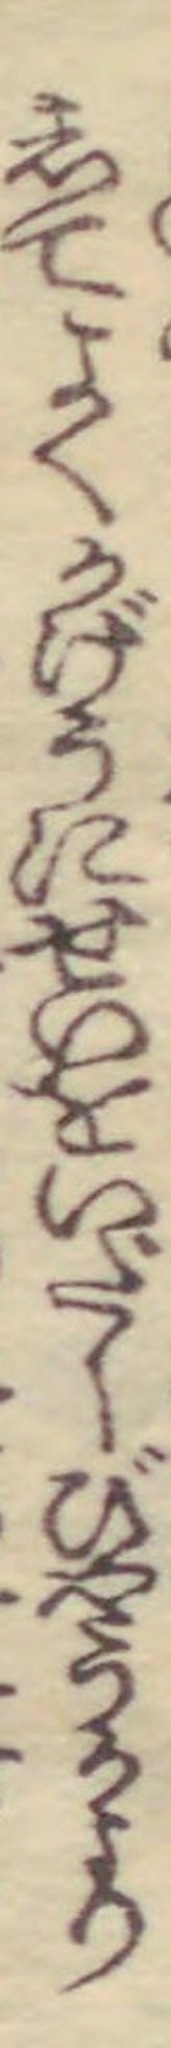してよくかげうにせいをいだしびやうかより
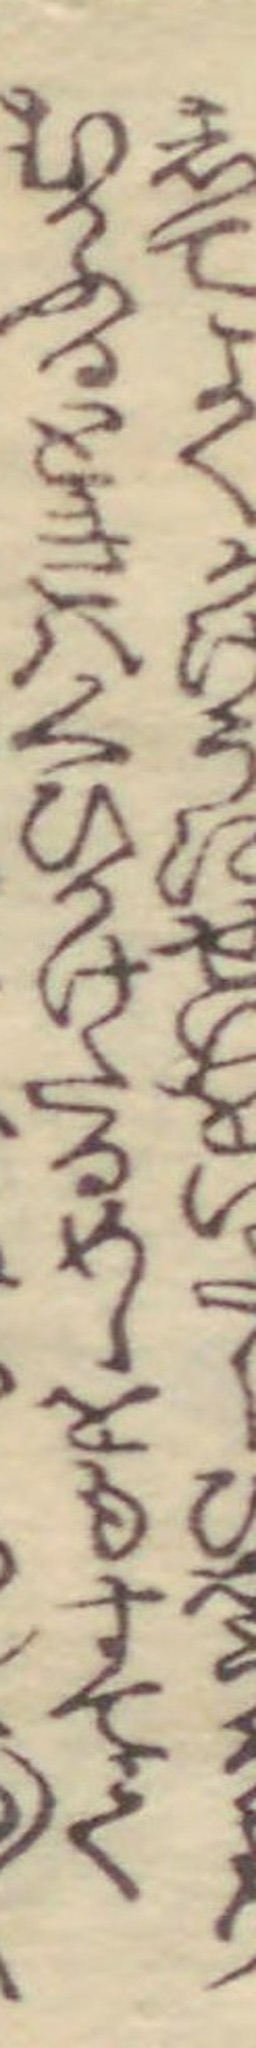むかふるときはくひかけたるめしをもすてて
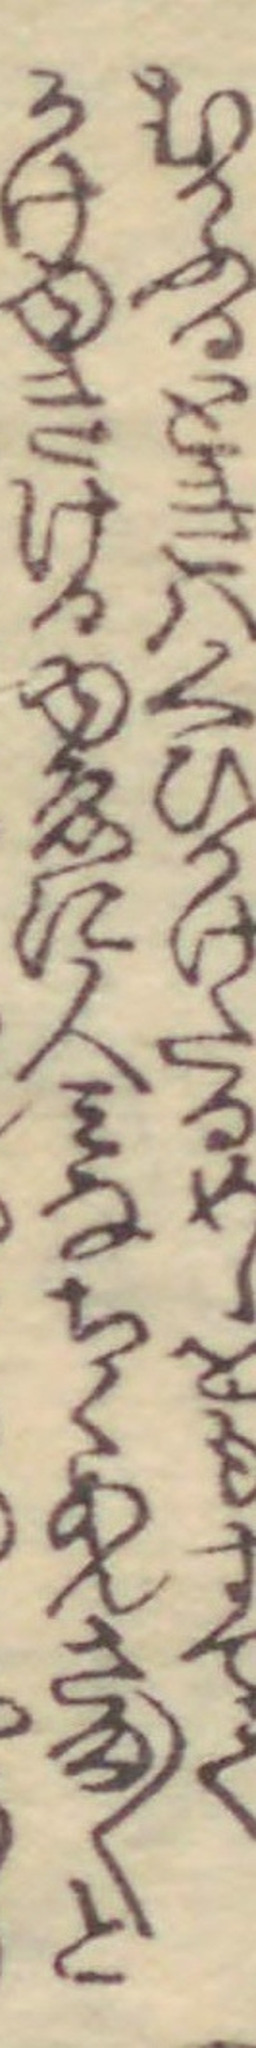かけゆきけるゆゑに人みなちくあんさま〳〵と
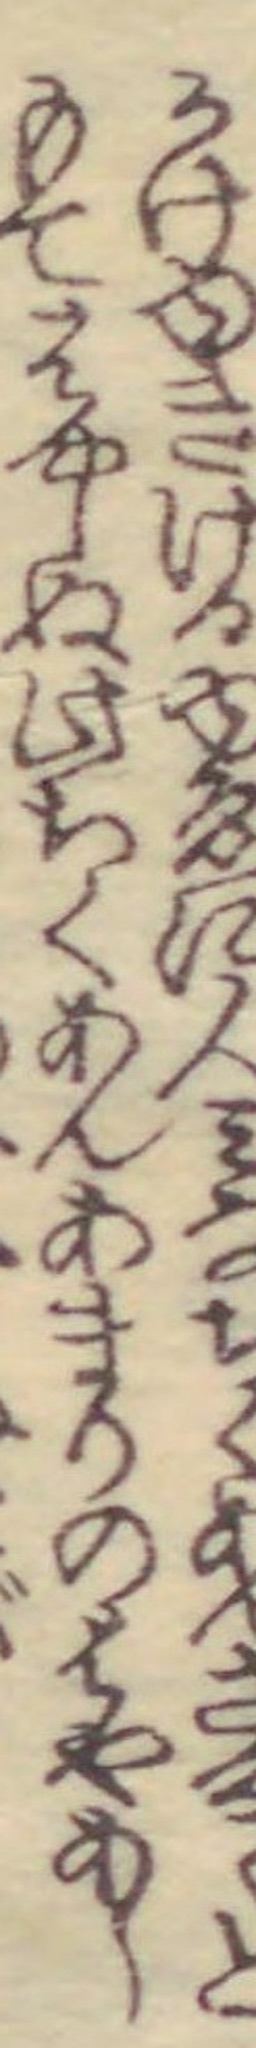もてはやしぬ此ちくあんあまりのはやあし
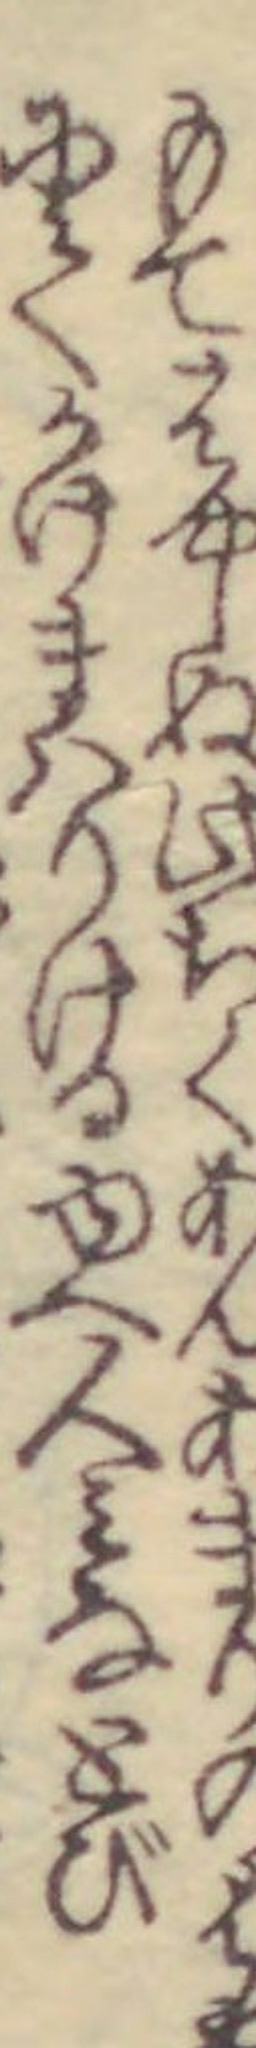にてかけまはりけるゆへ人みなとび
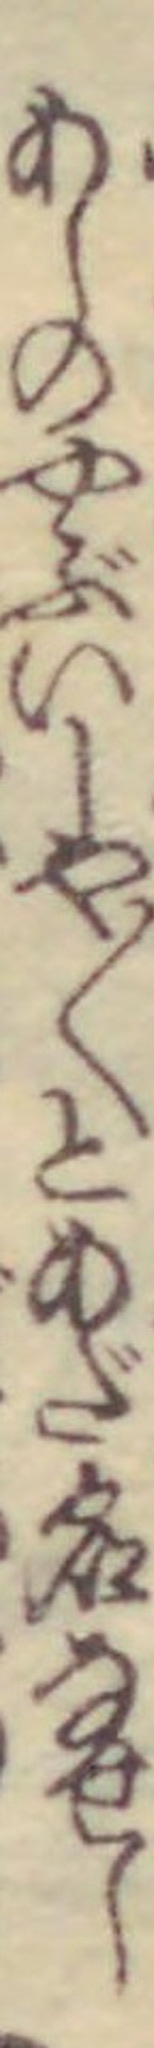あしのやぶいしや〳〵とあだ名なせし
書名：腹内窺機関 2巻
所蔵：国立国会図書館 National Diet Library, JAPAN
